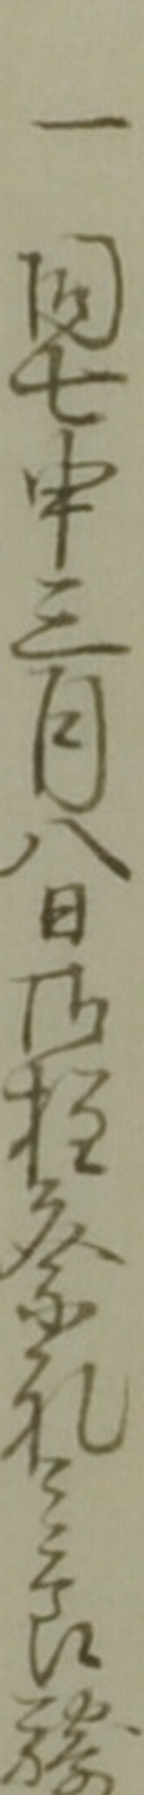一同七申三月八日御柱祭礼之節騎馬勤
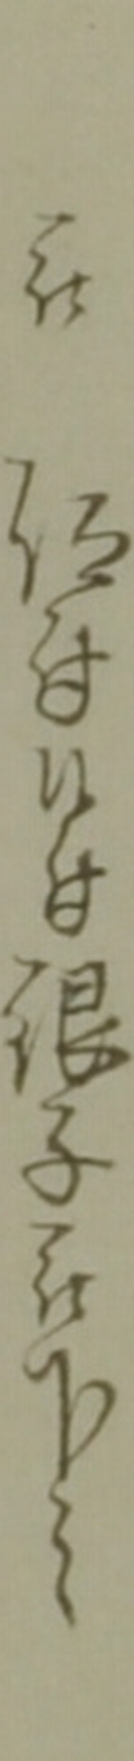被仰付候ニ付銀子被下之
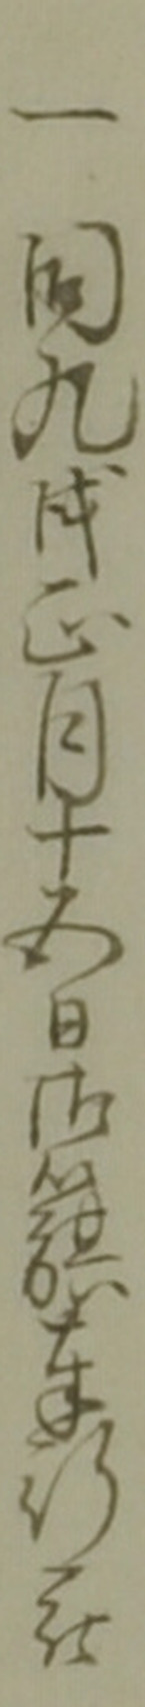一同九戌正月十五日御籏奉行被
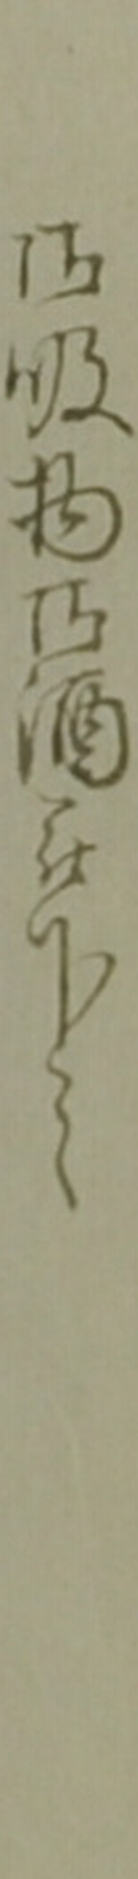御吸物御酒被下之
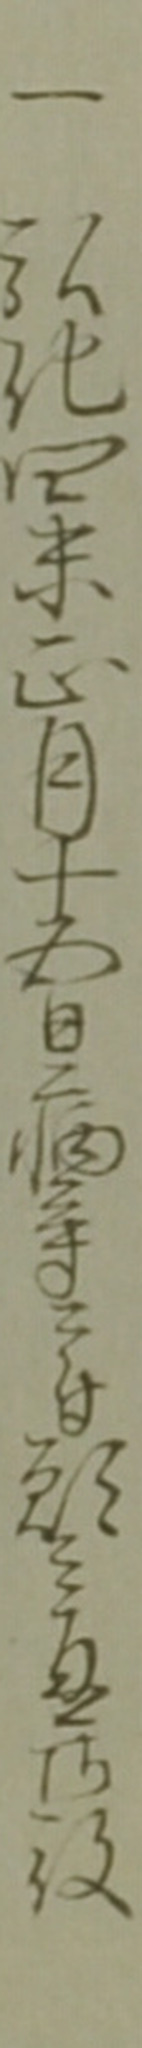一弘化四未正月十五日病気ニ付願之通御役
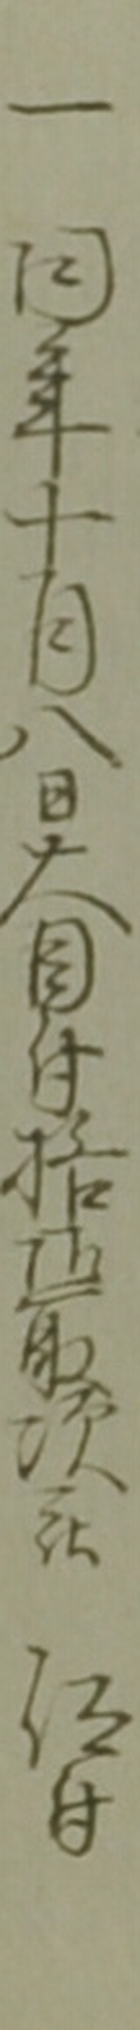一同年十月八日大目付格御取次被仰付

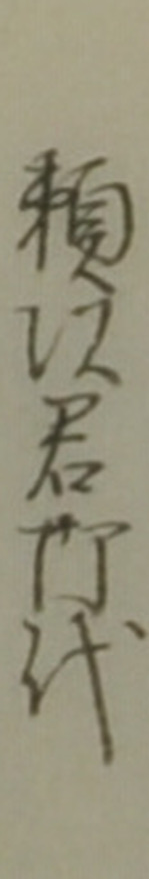頼以君御代
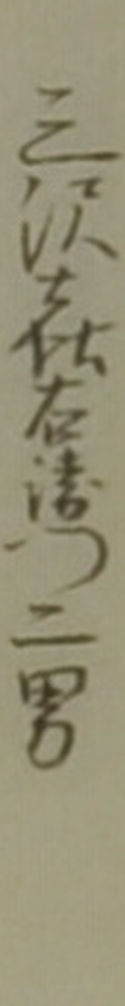三沢喜右衛門二男
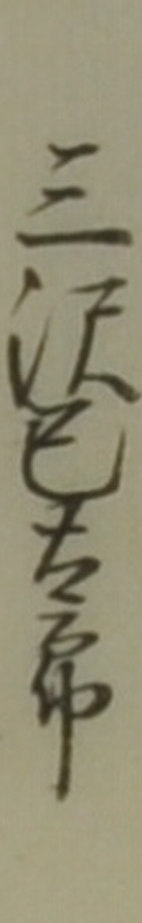三沢巳太郎
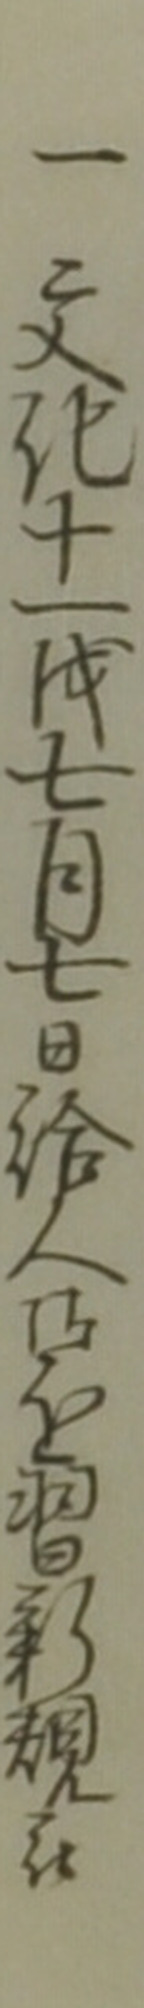一文化十一戊七月七日給人御近習新規被
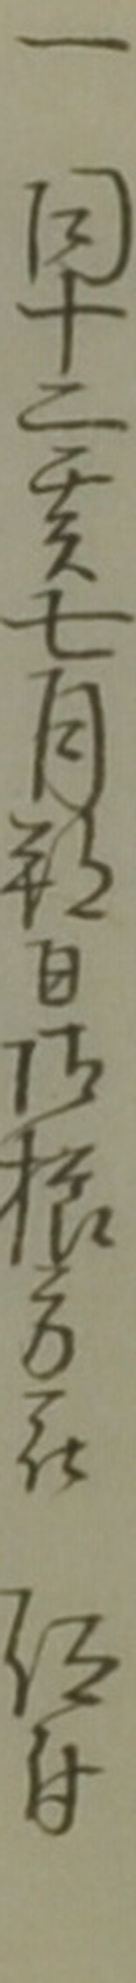一同十二亥七月朔日御様方被仰付
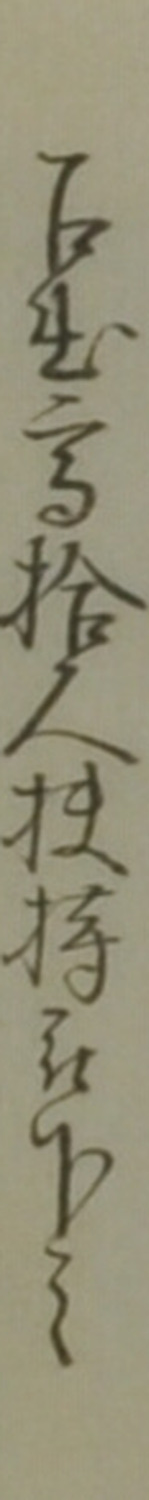召出高十人扶持被下候
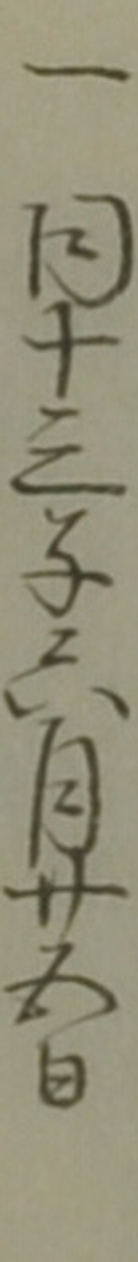一同十三子六月廿五日
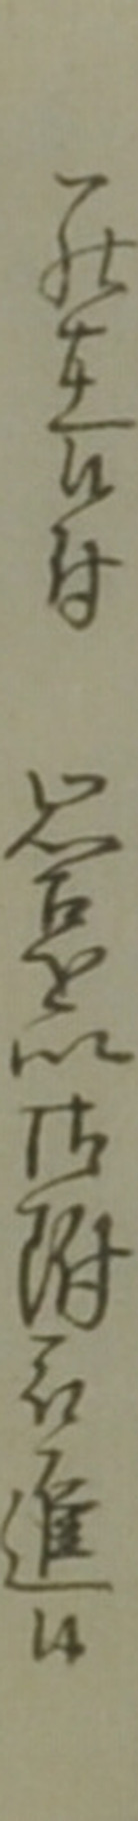罷在候付思召を以御附被進候
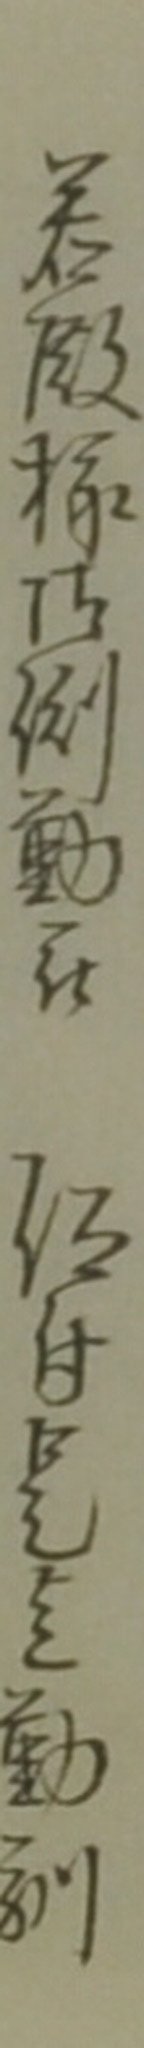若殿様御側勤被仰付是迄勤馴
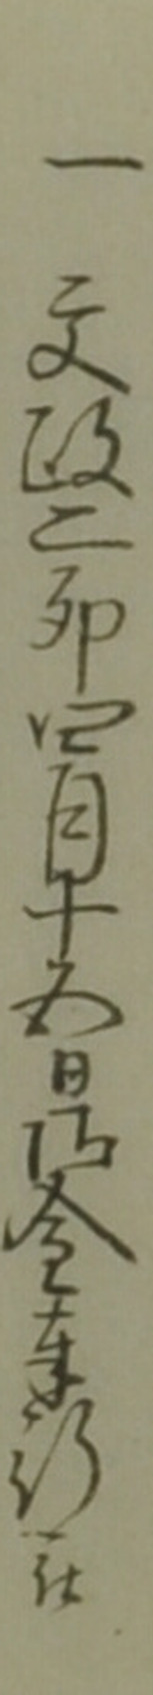一文政二卯四月十五日御金奉行被
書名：給人諸士勤仕録（三）
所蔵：伊那市立高遠町図書館・合同会社AMANE
